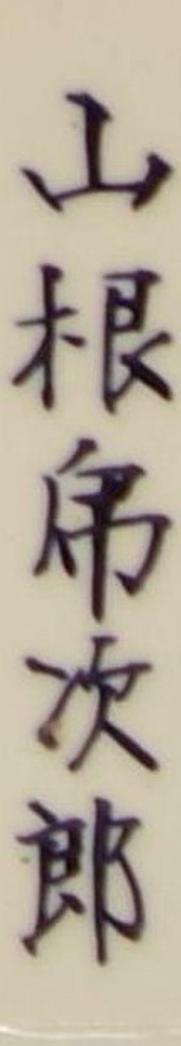山根帛次郎
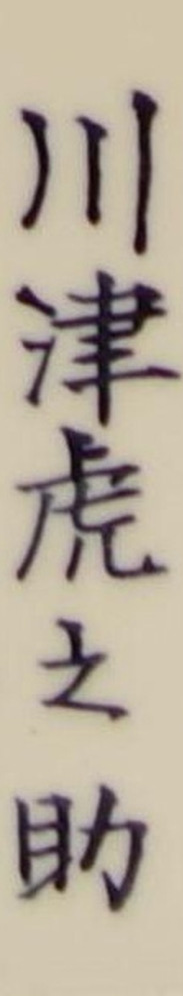川津虎之助
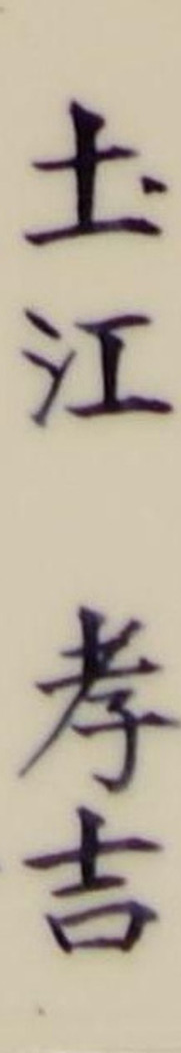土江孝吉
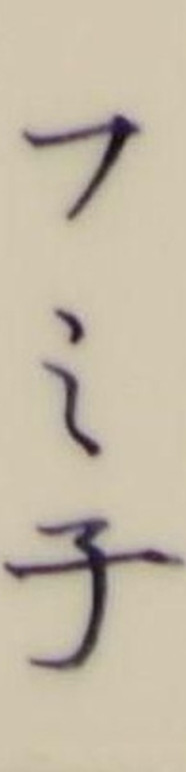フミ子
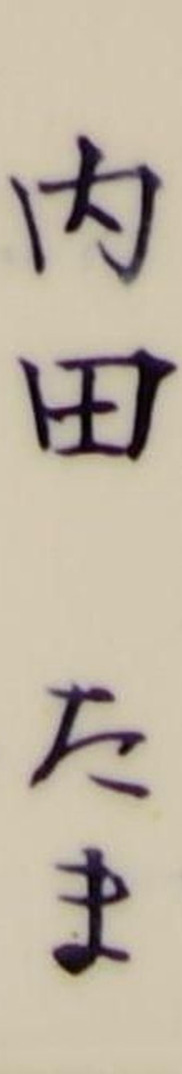内田たま
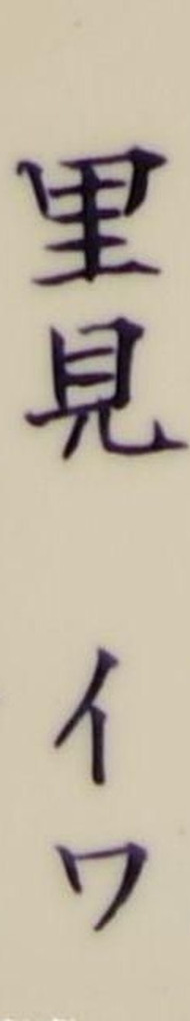里見イワ
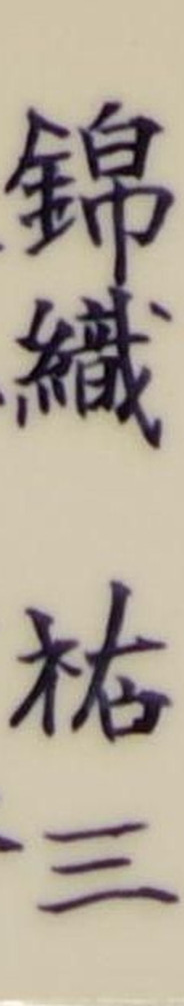錦織祐三
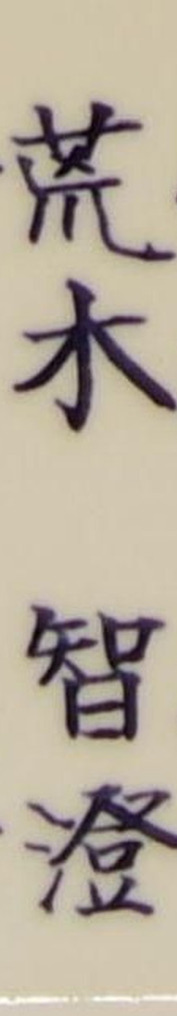荒木智澄
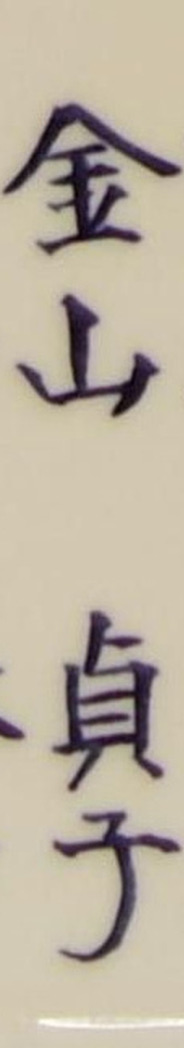金山貞子
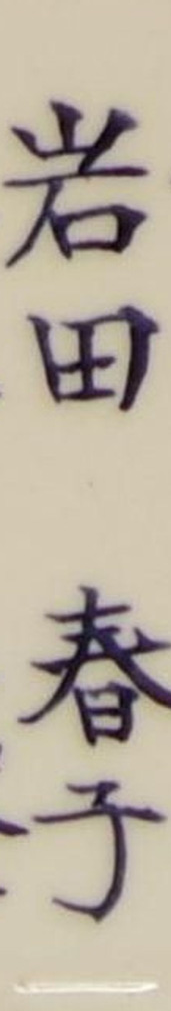岩田春子
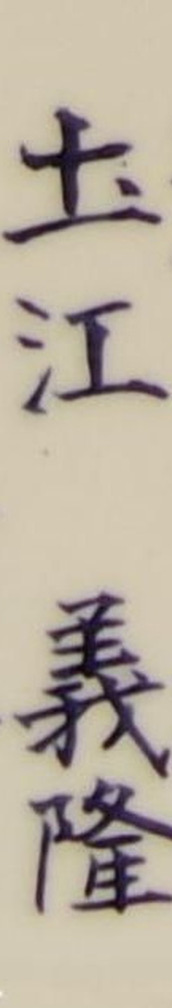土江義隆
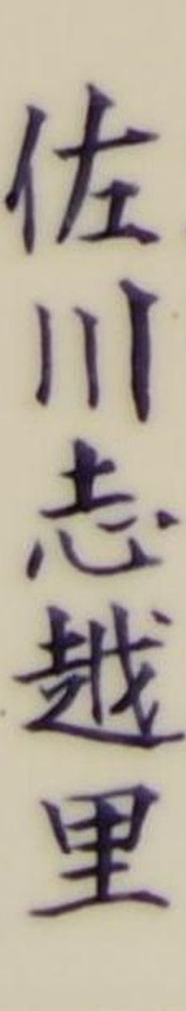佐川志越里
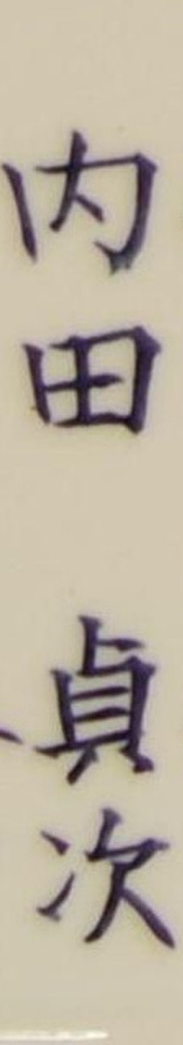内田貞次

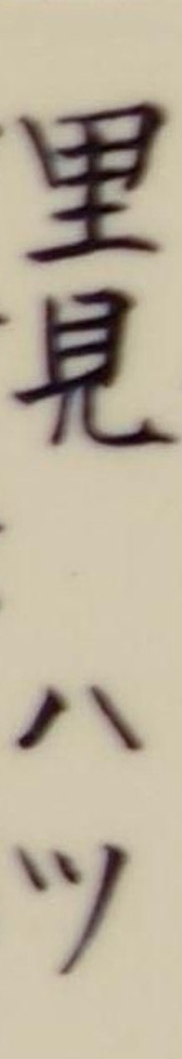里見ハツ
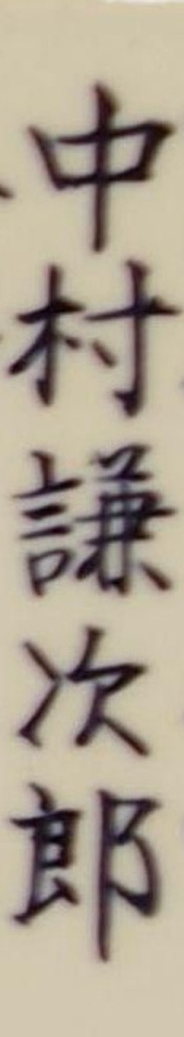中村謙次郎
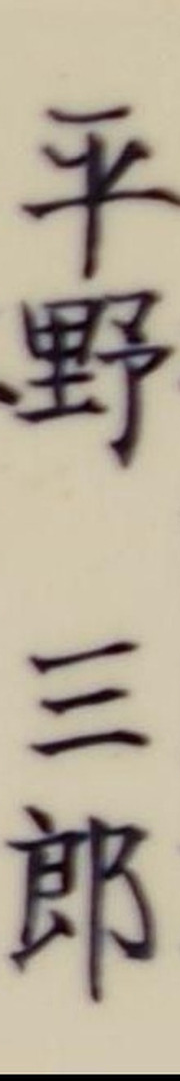平野三郎
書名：E~L
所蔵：高野山金剛峯寺
